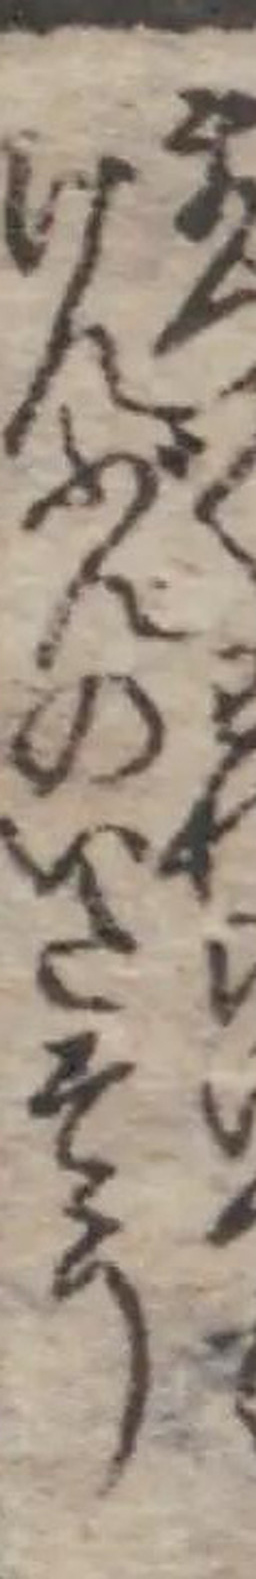けんぶんのいたそう
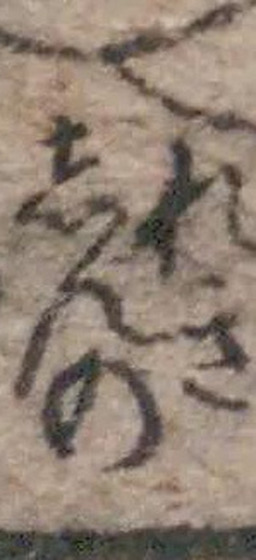しんの
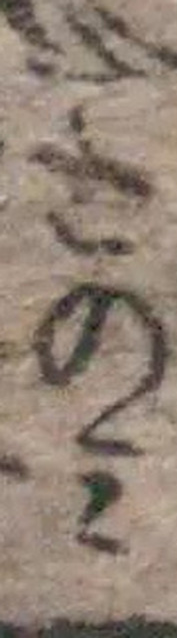たのみ
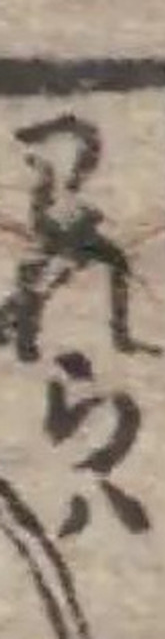われらは
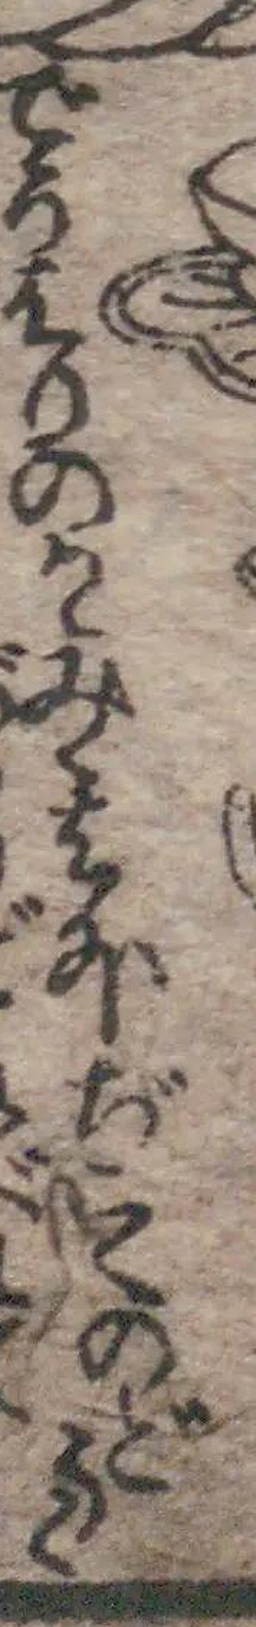でうはりのかゝみ其外ぢこくのどうく
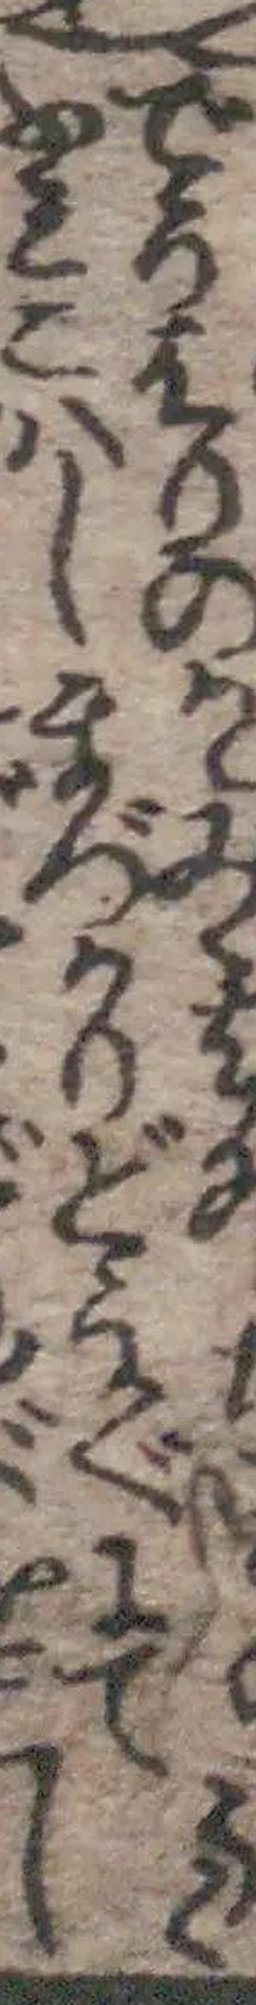ふみこはしまづかりどうぐにて
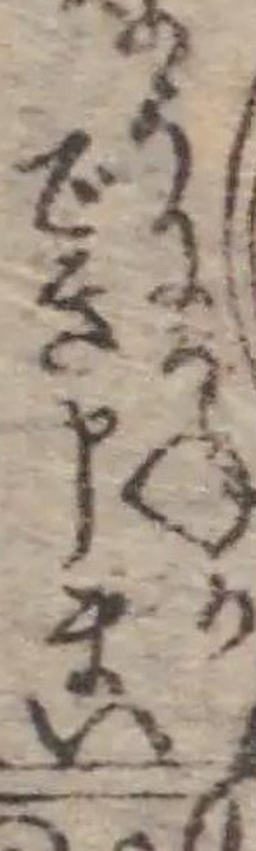でき申まい
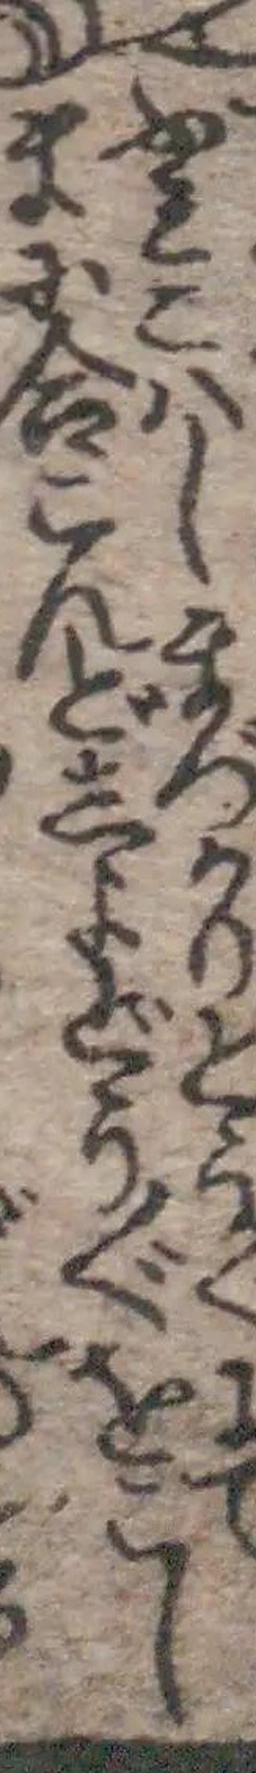まに合こんどしよどうぐをこし
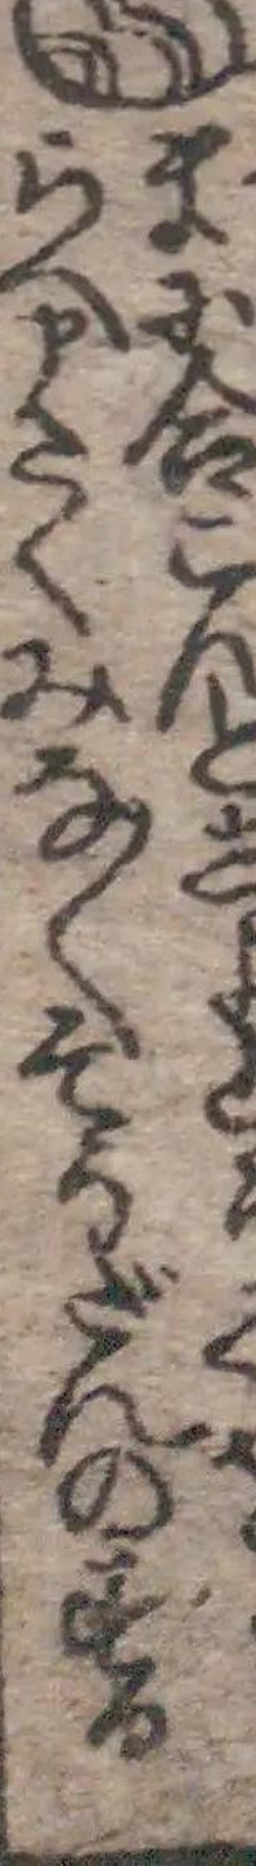らへ申たくみな〳〵そうだんのする

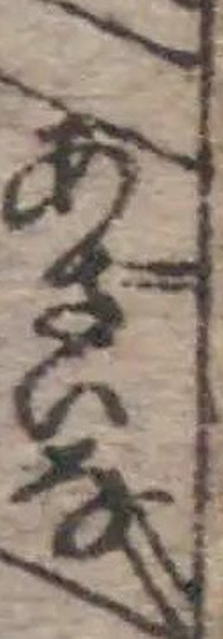あさいな
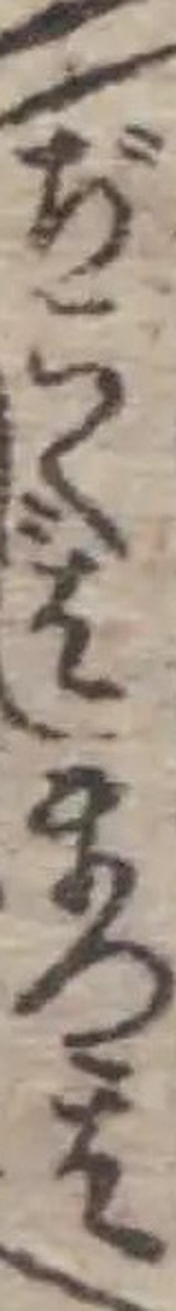ぢこくはじまつて
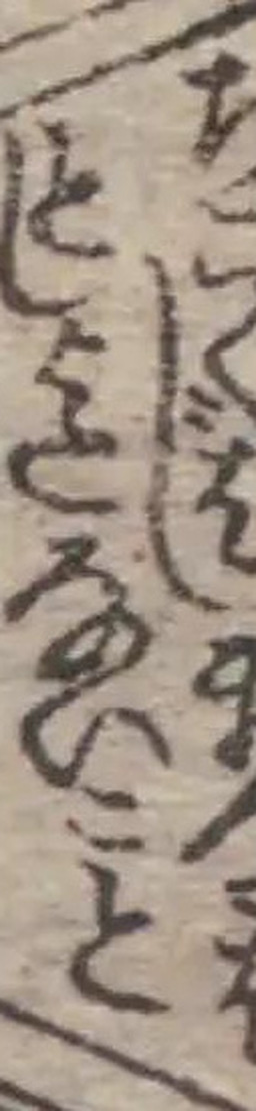とし迄ないこと
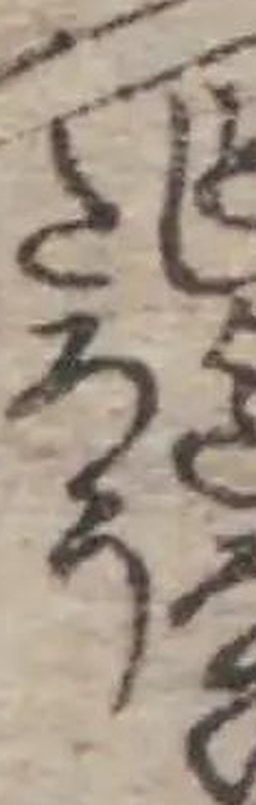たろう
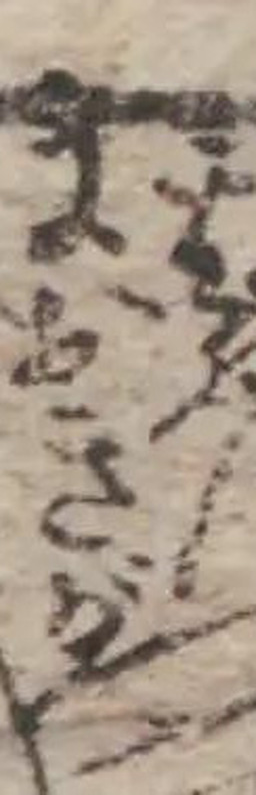におきが
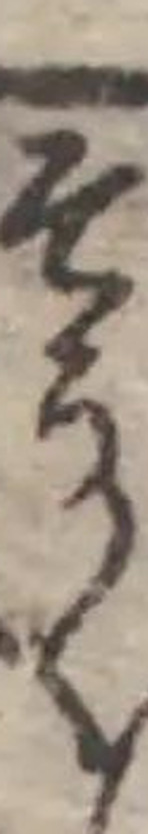そう〳〵
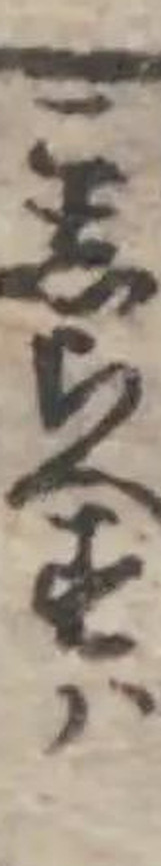こしらへすは
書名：大磯地蔵咄 2巻
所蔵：国立国会図書館 National Diet Library, JAPAN
